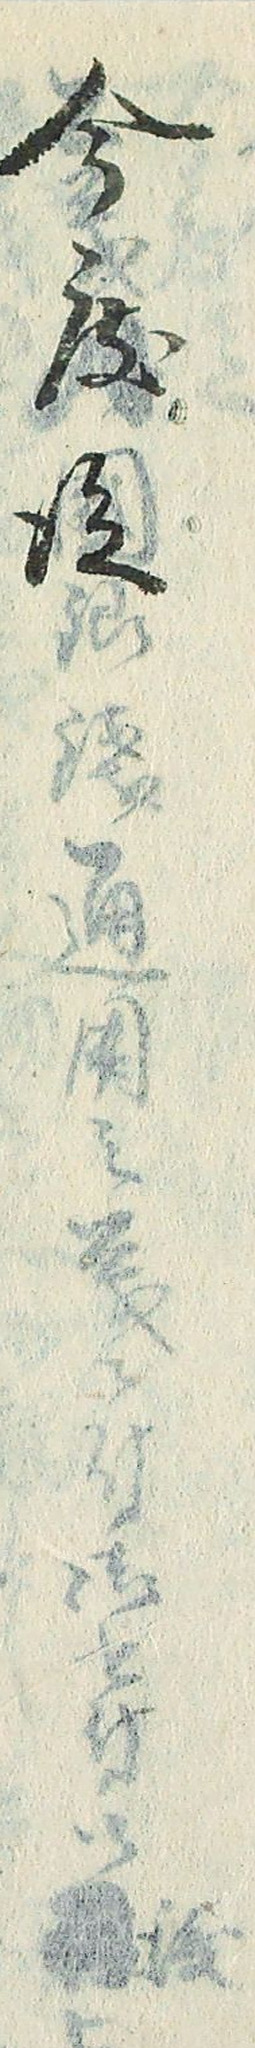今度従
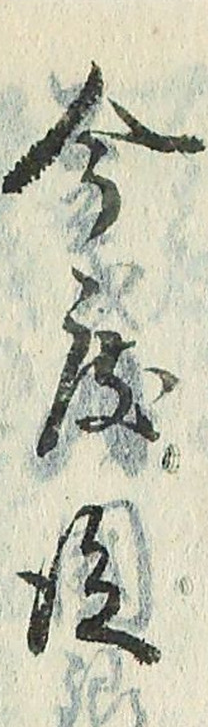今度従
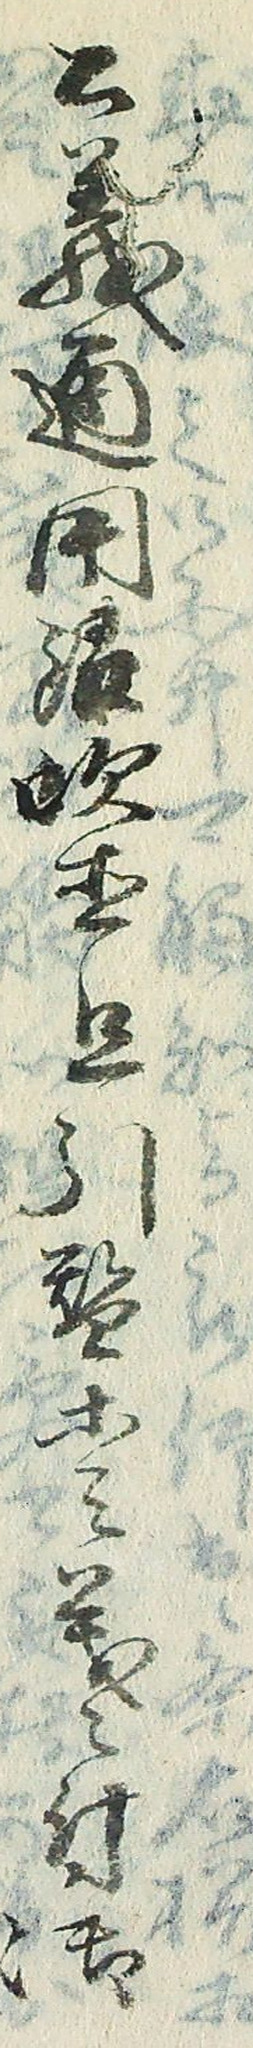公義通用銀吹直且引替等之義に付御
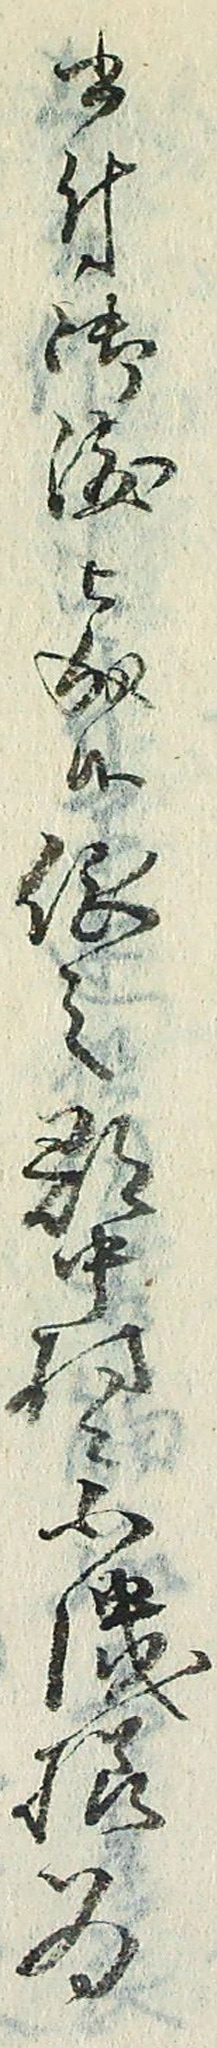書付御渡被成候依之郡中村々不洩様為
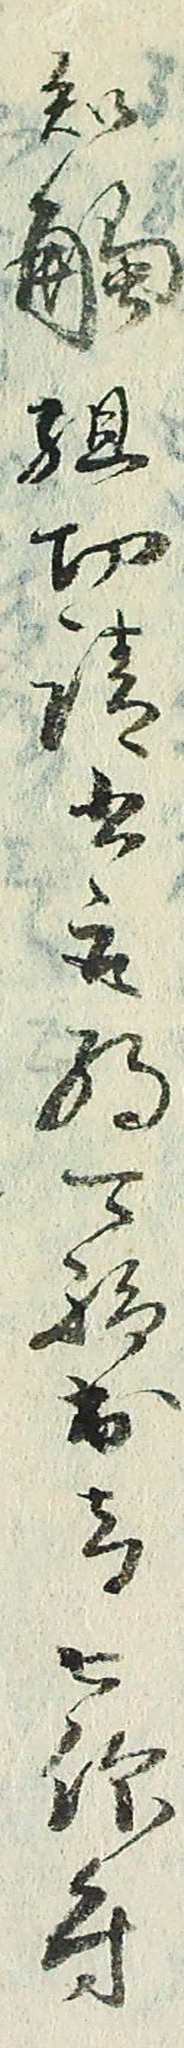知触組切請書取都可指出旨被仰付
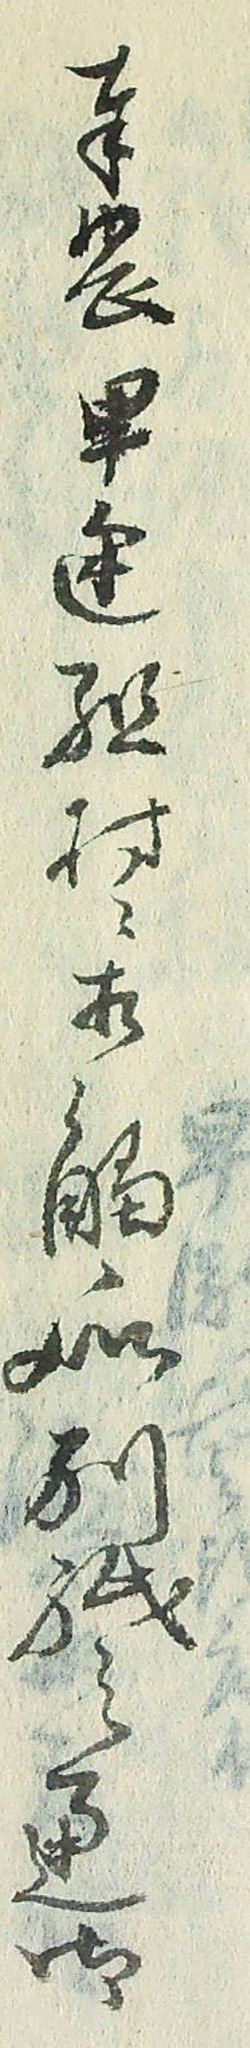奉畏早速組村々相触候処別紙之通御
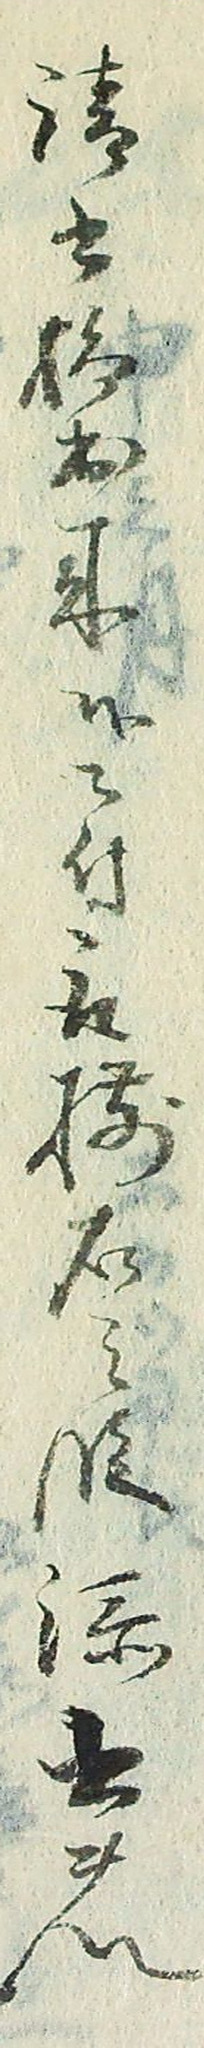請書指出来候に付取揃右之段添書を以
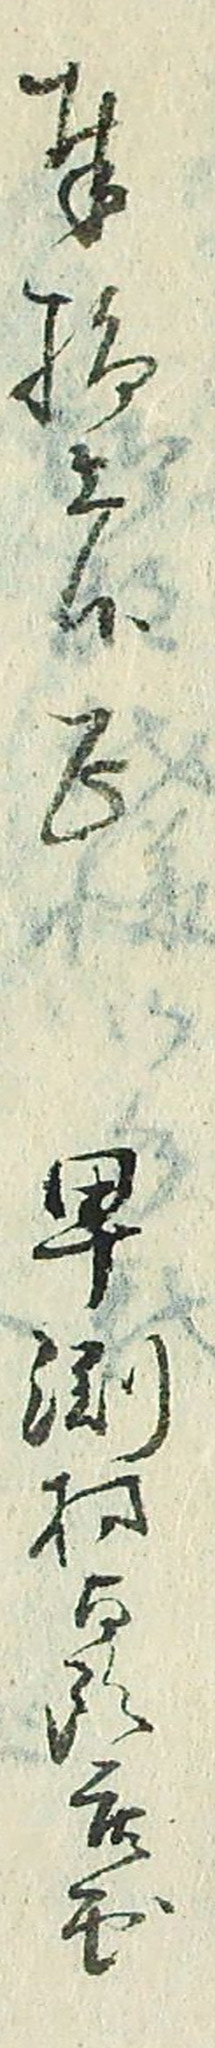奉指上候以上早渕村与頭庄屋
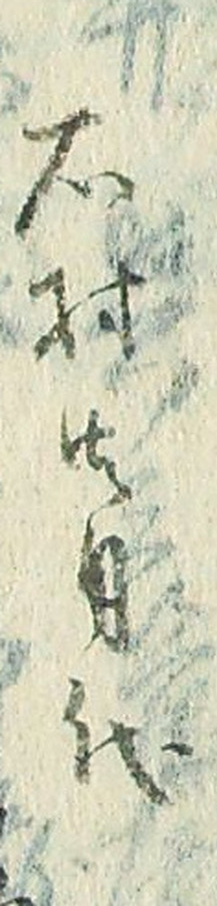右村御用代
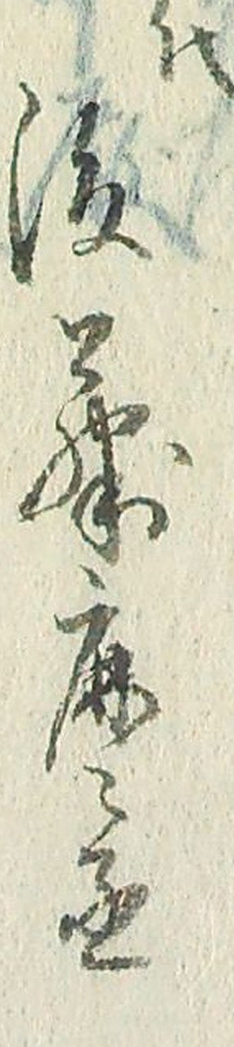後藤麻之丞
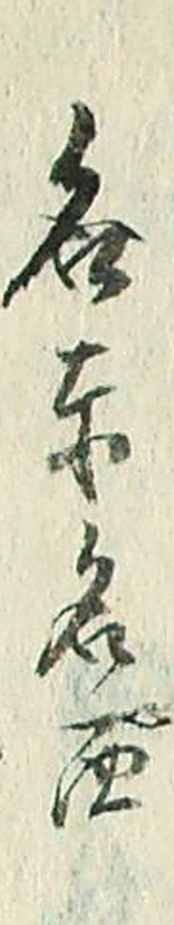名東名西
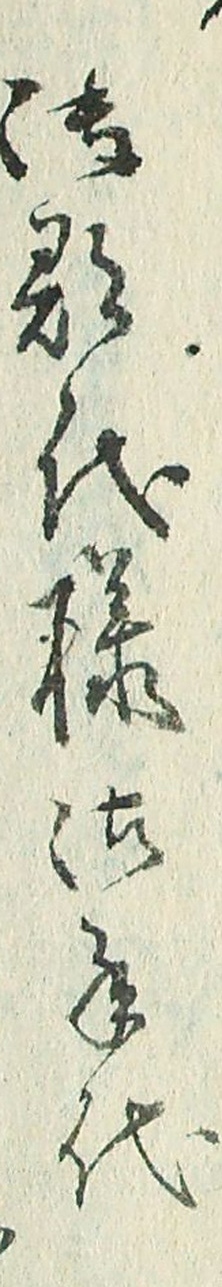御郡代様御手代
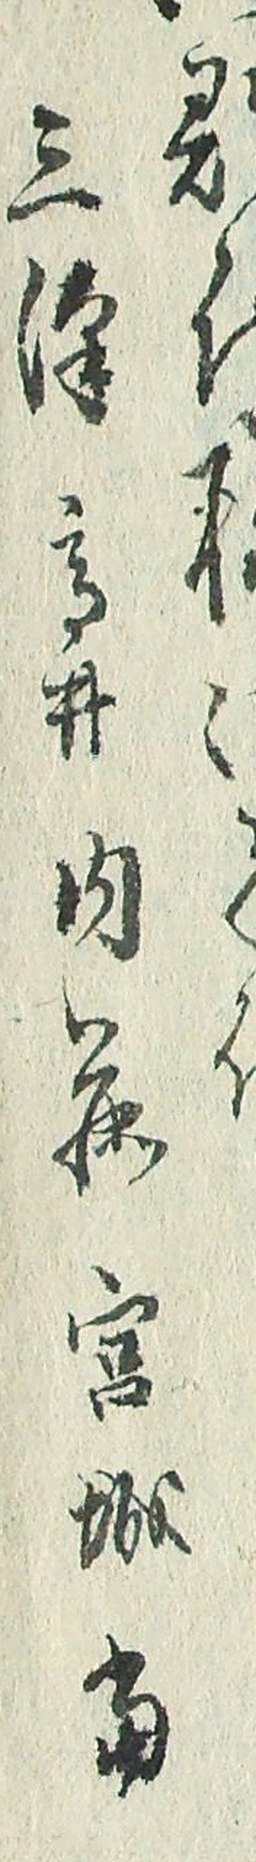三沢高井内藤宮城当

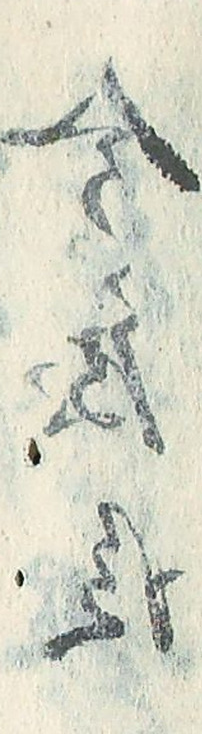今度従
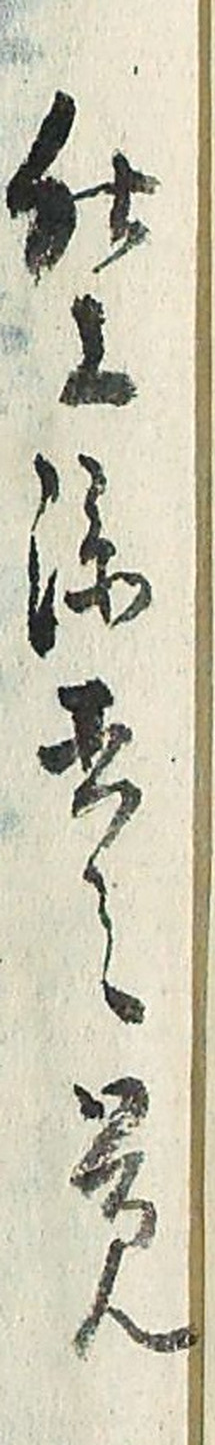仕上添書之覚
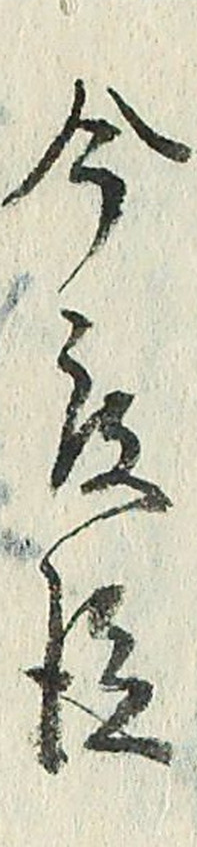今度従
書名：諸御用御□受書控
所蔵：鳴門教育大学 Naruto University of Education
